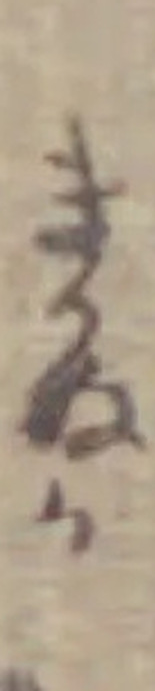きかぬか
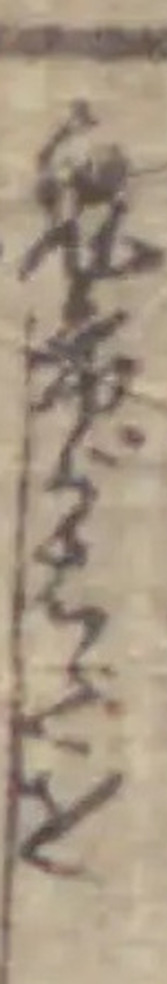鬼市がはだを
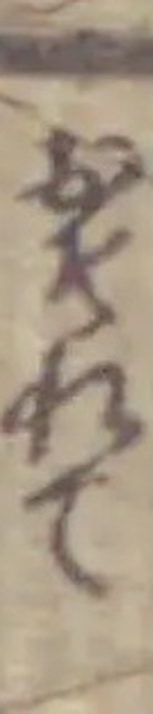おそれて
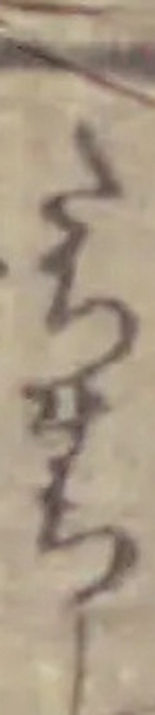たちまち
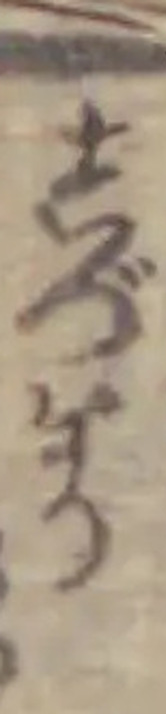しづまり
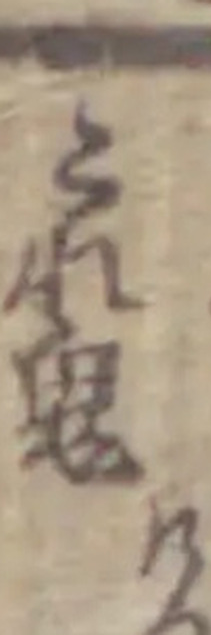これ鬼
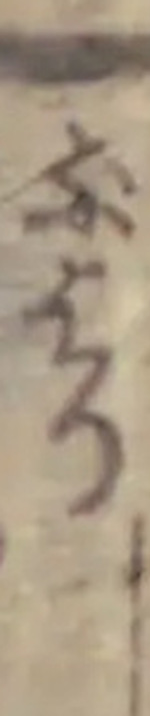ぶはり

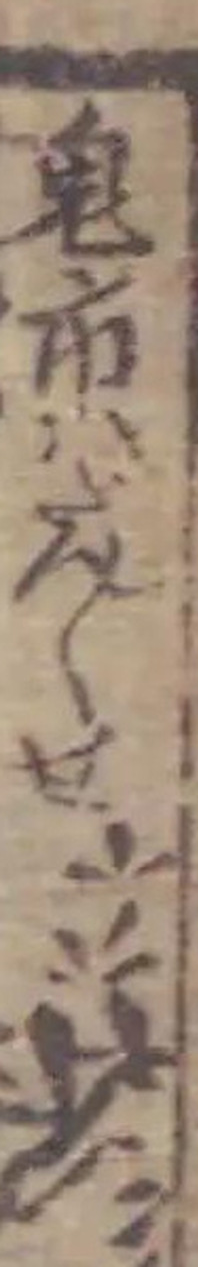鬼市はたん〳〵せ
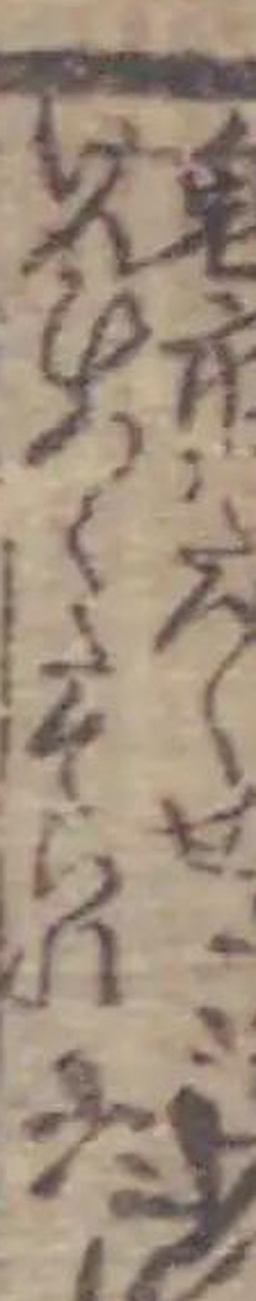けんひろくたてられ
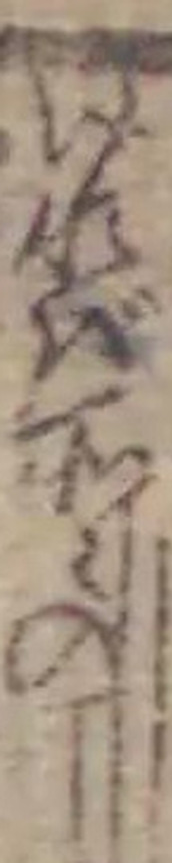ければ所々の
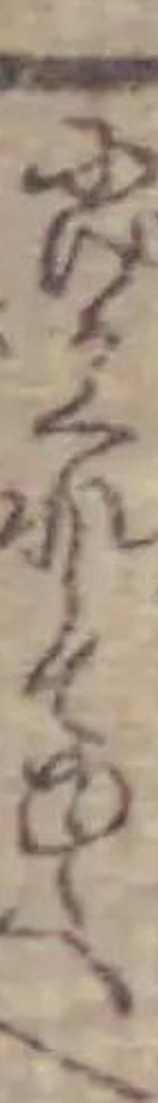にげかくれしてゆくへ
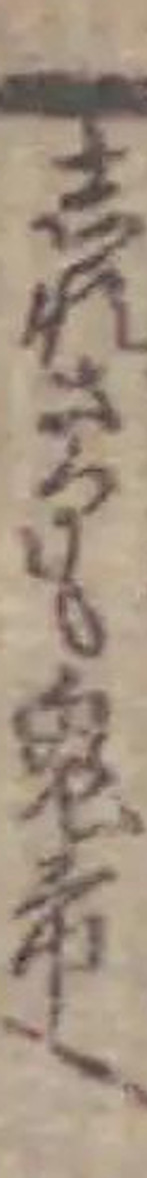しれざるも鬼市
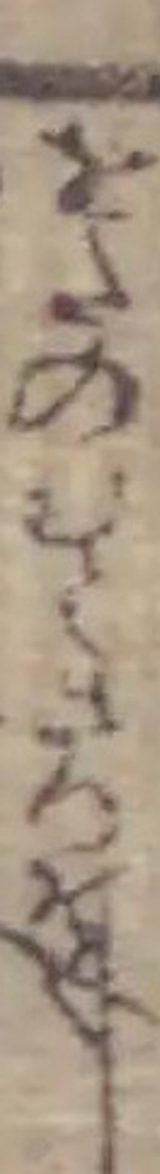をたのむとさつそく
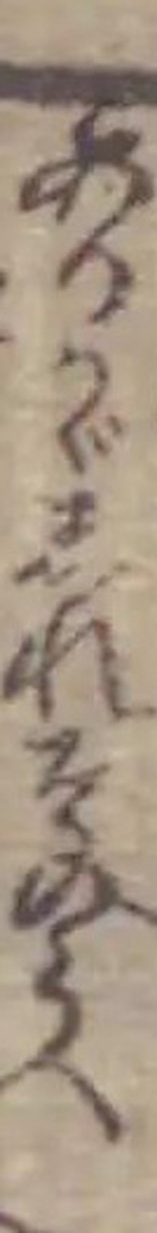ありかゞしれそのうへ
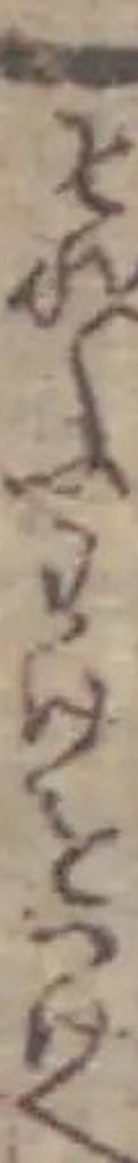それ〳〵にわけをつけ
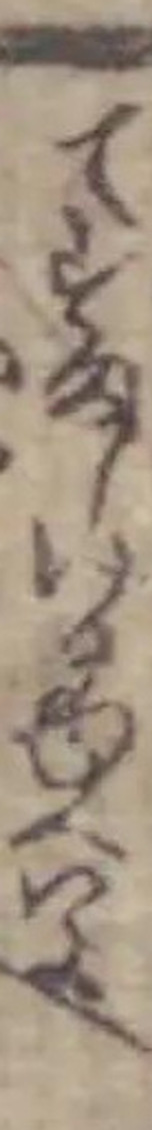てすましけるゆへいよ
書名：鬼子宝 3巻
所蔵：国立国会図書館 National Diet Library, JAPAN
